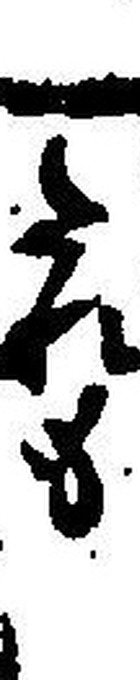たれも
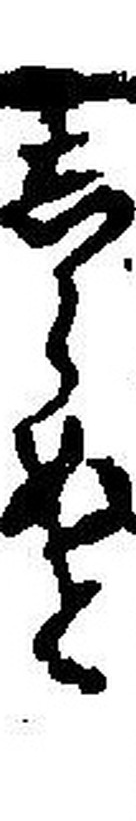しらぬと
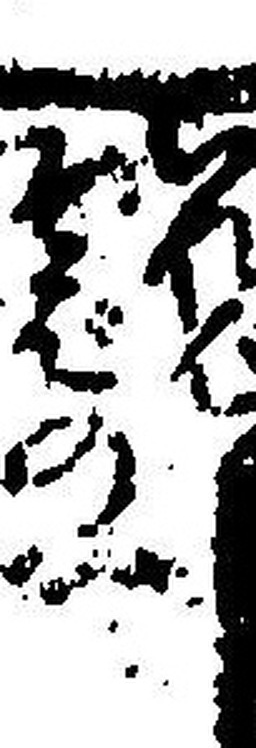そばの
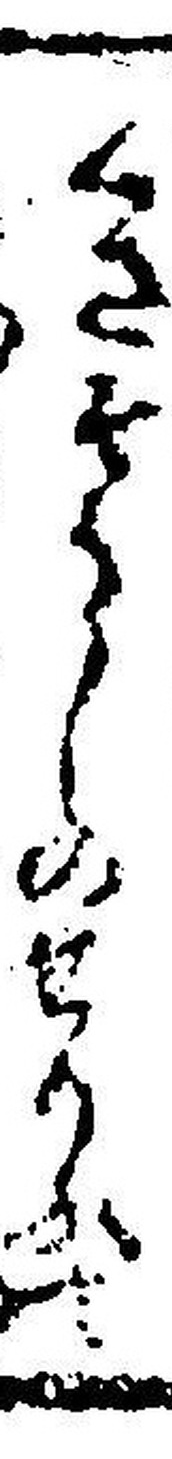くさぞうしのせりふの
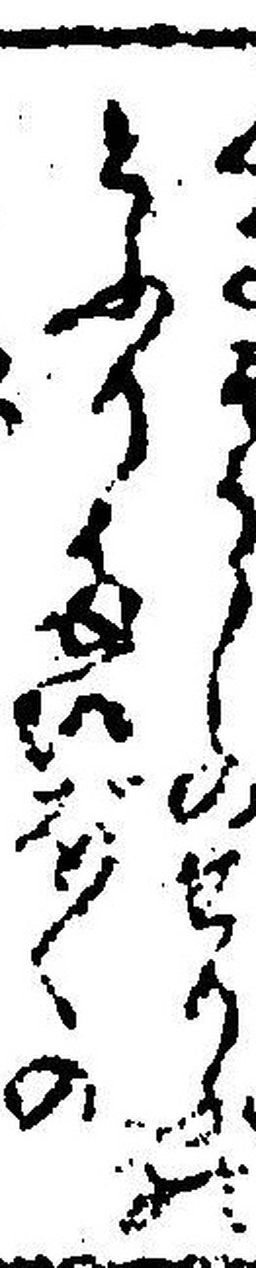とふりたいぼくの
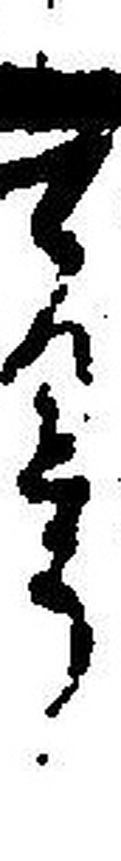てんとう
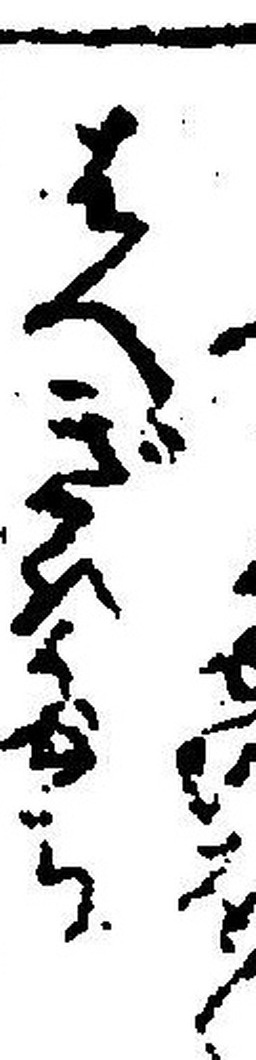はへぎはたち
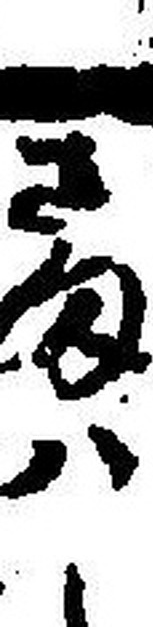さまは
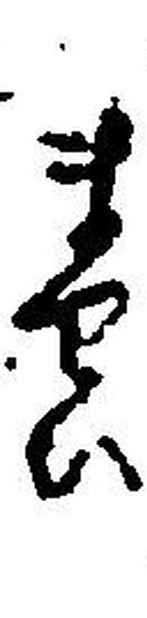ませい
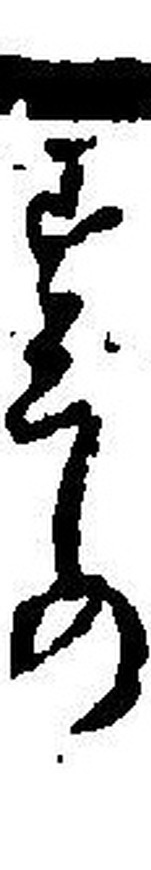すこしの
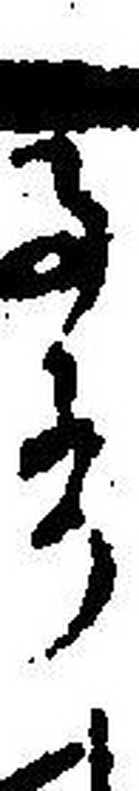事より
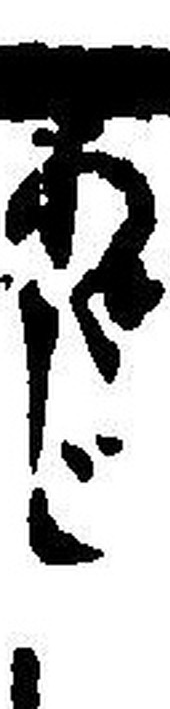あぐじ
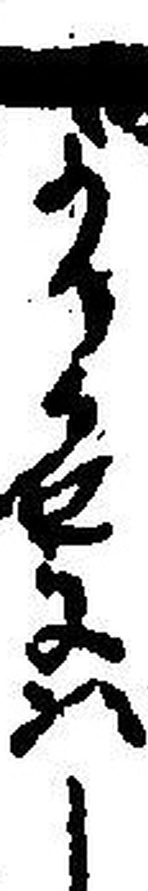よりかせには
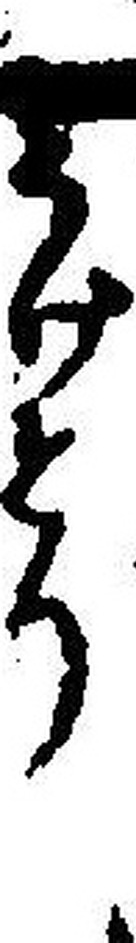うけとり
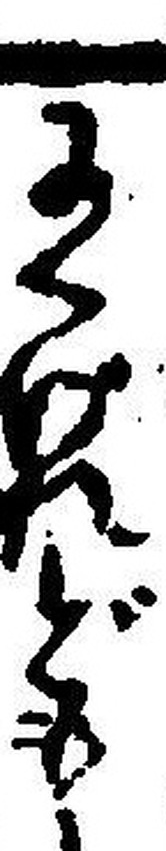にくけれども
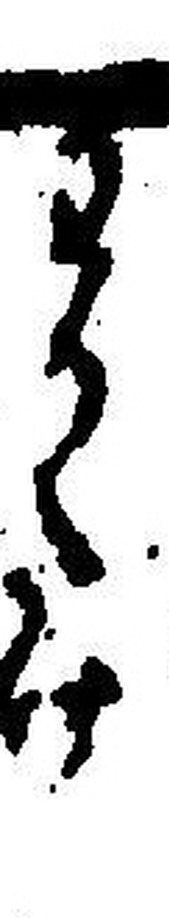わりたけ
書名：御代参牛時詣 / 市場通笑作
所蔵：東京大学総合図書館 General Library in the University of Tokyo, JAPAN
